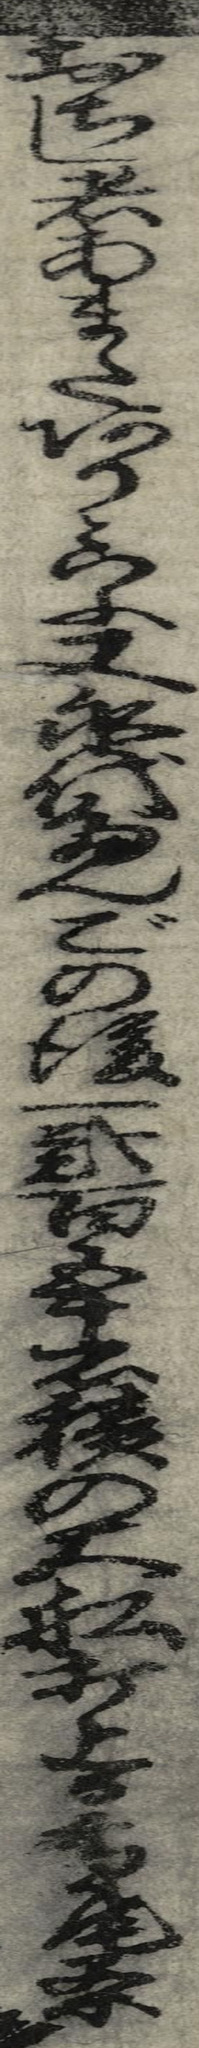おちし者あまたありといふ又永代だんごの後一弐百五十石積の大船打上る高尾茶
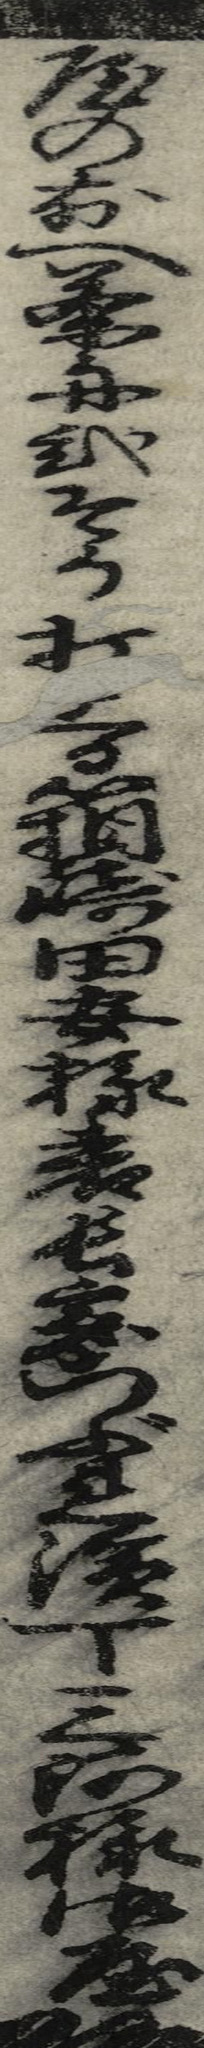屋の前へ茶舟弐そう打上る箱崎田安様表長屋つぶれ浜町三河様御屋
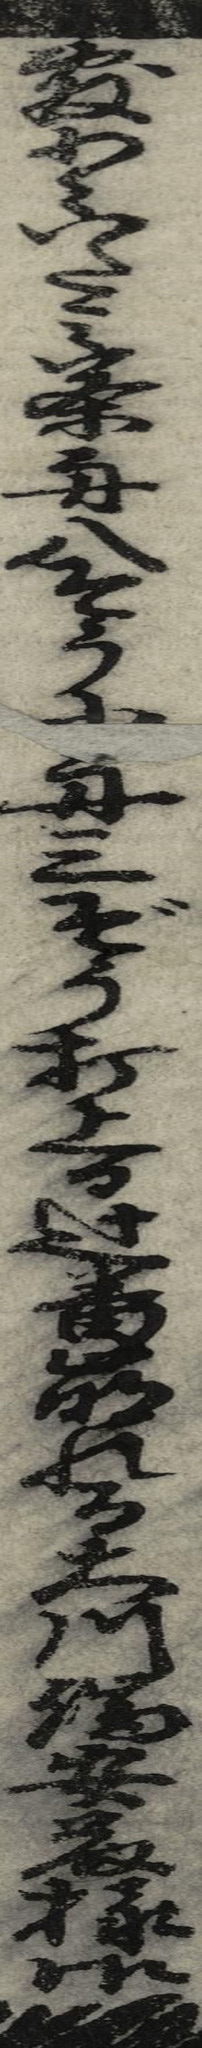敷少々いたミ茶舟八そう小舟三ぞう打上る辻番崩れる大川端安藤様御
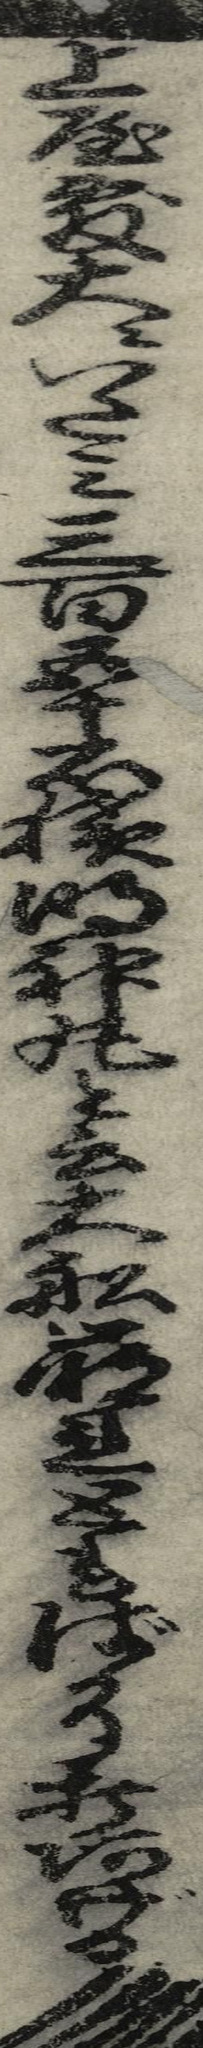上屋敷大二いたミ三百五十石積明神丸と云大船崩れともばかり打あける
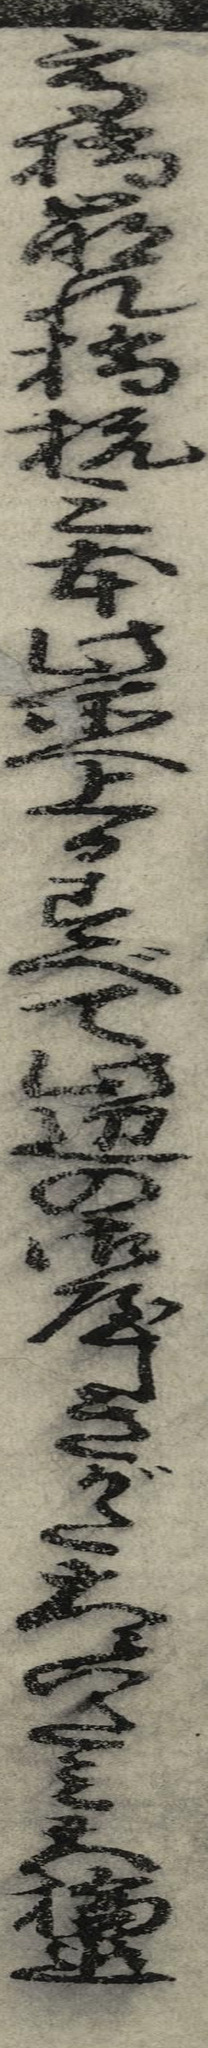高橋崩れ橋杭三本此所へ上るすべて此辺の御屋しきがた大二いたミ大橋辺
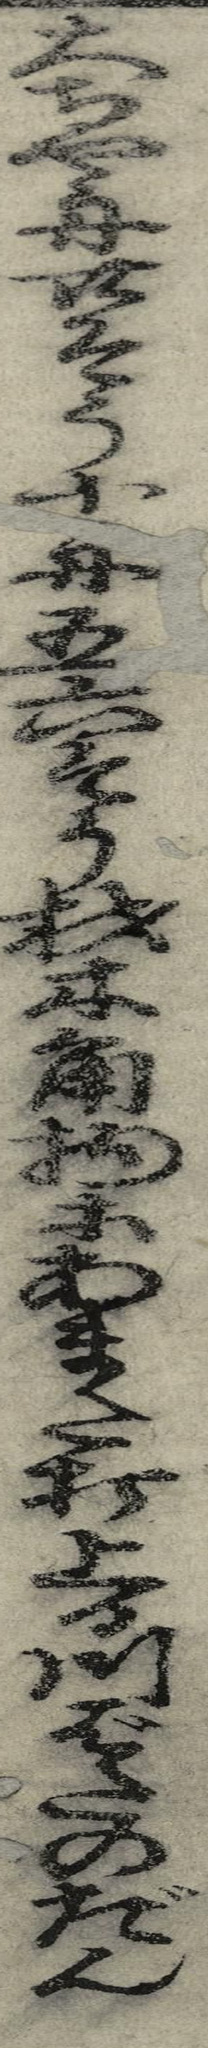大ちや舟廿そう小舟五六そう材木角物等あまた打上る川ばたのだん
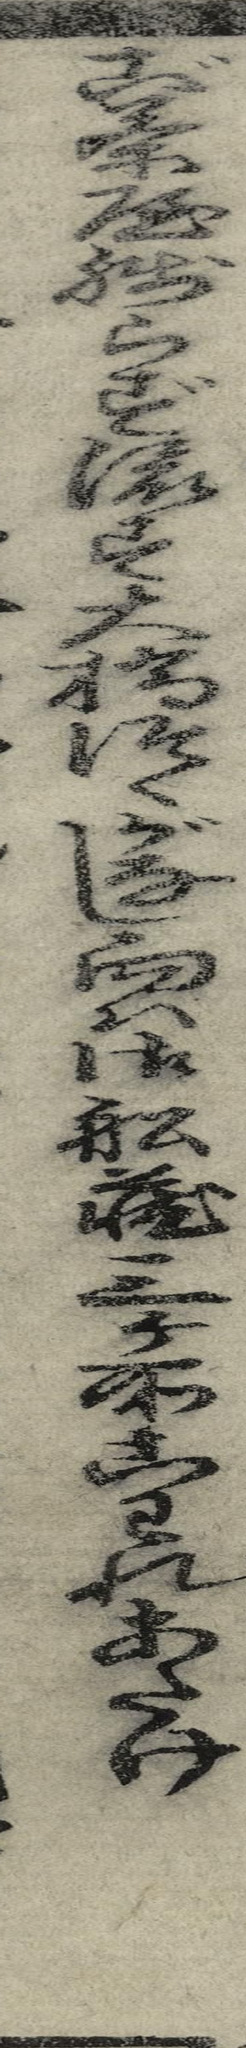ご茶屋残らず流す大橋つゝがなし向ハ御船蔵三ヶ所こわれあたけ
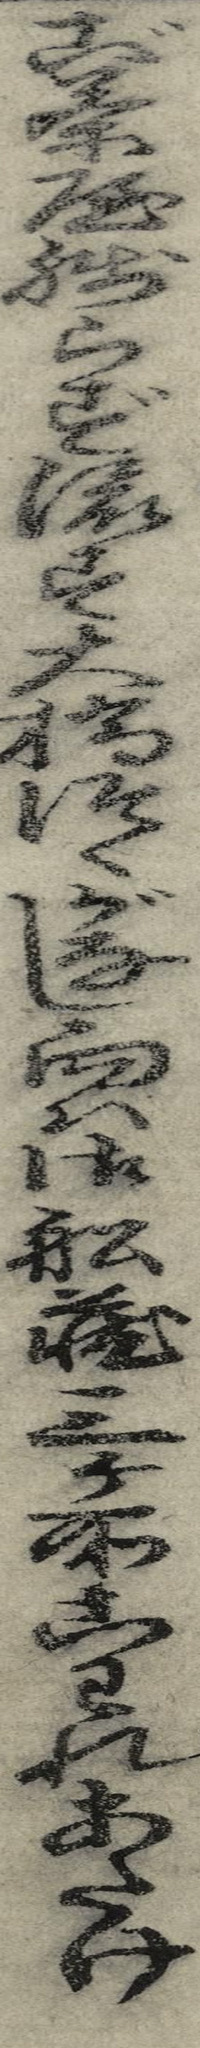ご茶屋残らず流す大橋つゝがなし向ハ御船蔵三ヶ所こわれあたけ
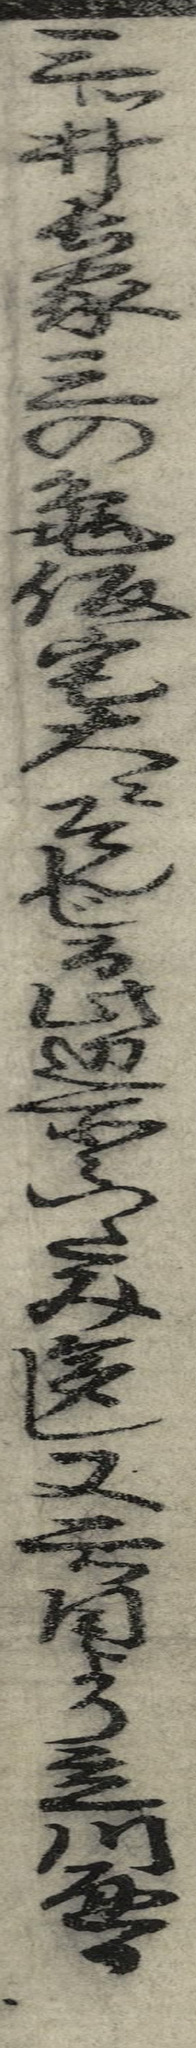三ツ井長家三の亀仮宅大二そんじる此辺所々いたみ多し又二ッ目より立川通り
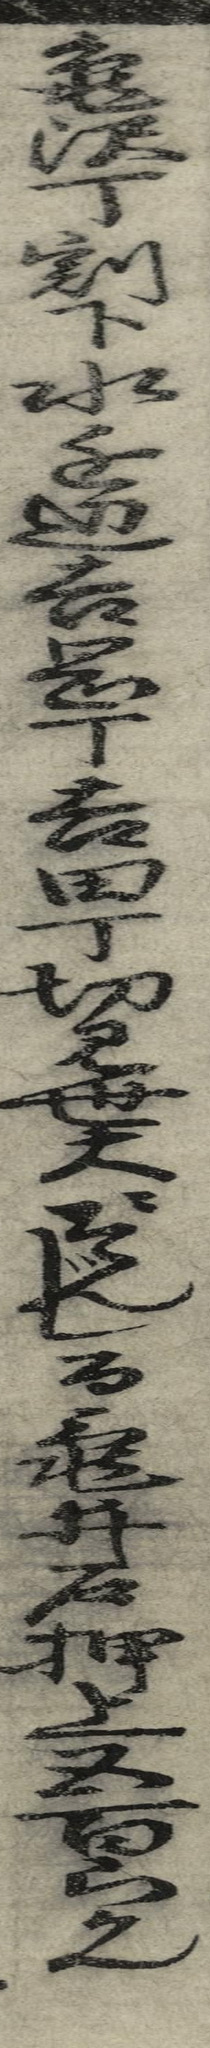亀沢丁割下水近辺吉岡丁吉田丁切見世大二そんじる亀井戸押上五百らかん
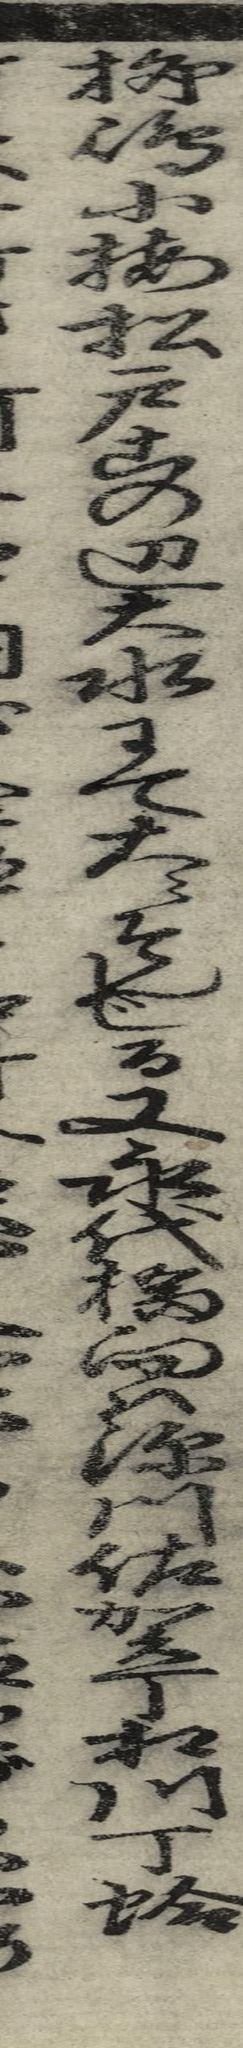柳嶋小梅松戸この辺大水にて大二そんじる又永代橋向ハ深川佐賀丁松川丁蛤
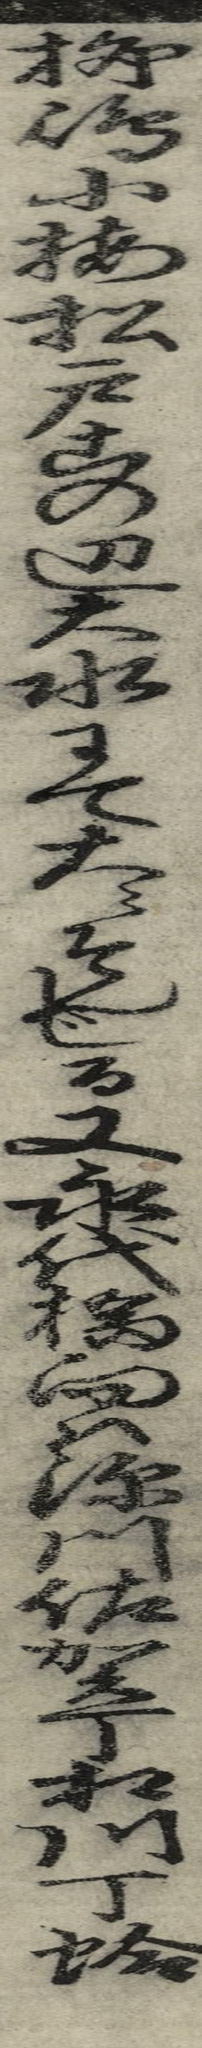柳嶋小梅松戸この辺大水にて大二そんじる又永代橋向ハ深川佐賀丁松川丁蛤
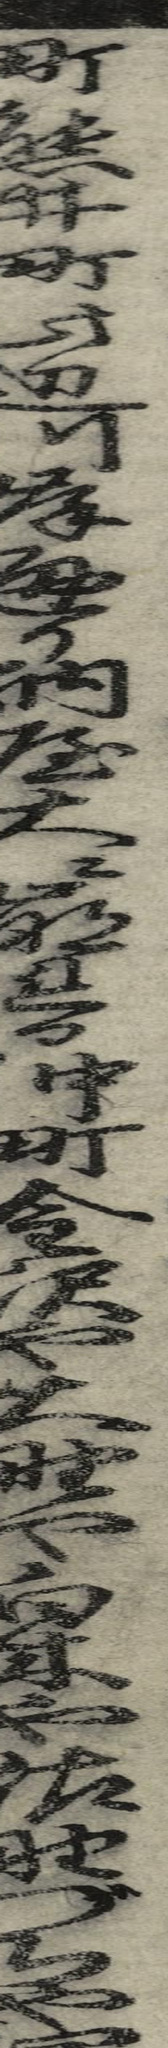町熊井町此辺河岸通り納屋大二崩れる仲町金沢や大野や白木や佐野づちや四軒
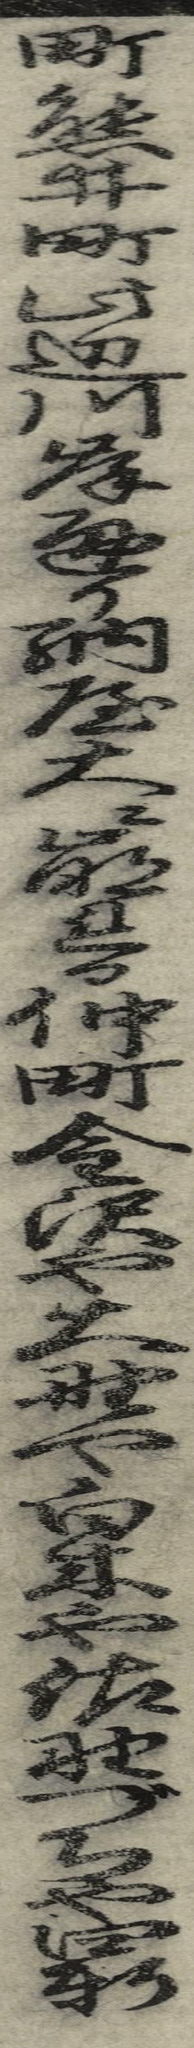町熊井町此辺河岸通り納屋大二崩れる仲町金沢や大野や白木や佐野づちや四軒
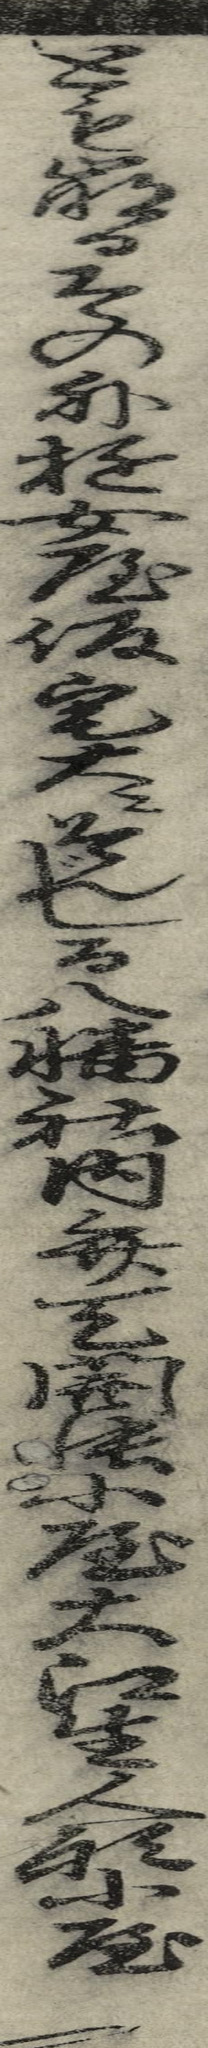とも崩るその外遊女屋仮宅大二そんじる八幡社内弁天開帳小屋大江生人形小屋
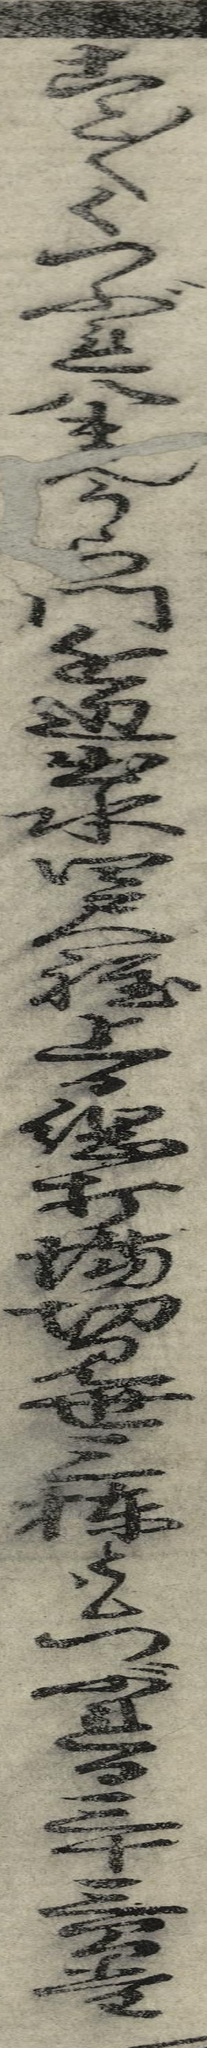こと〳〵くつぶれ八まんうら門近辺出水四尺程上る綱打場切見世三棟ともつぶれる三十三間堂
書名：安政三辰八月廿五日　大風雨出水損場所之圖
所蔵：東京大学地震研究所図書室 Earthquake Research Institute Library, The University of Tokyo, JAPAN
